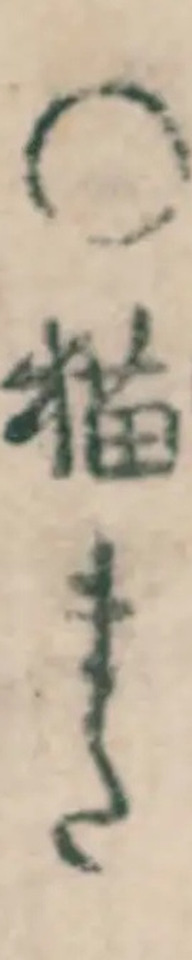○猫また

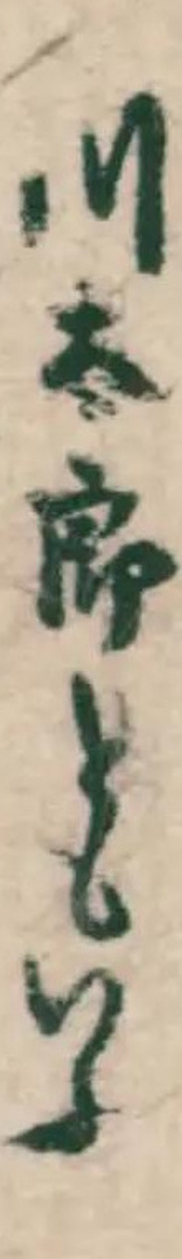川太郎ともいふ
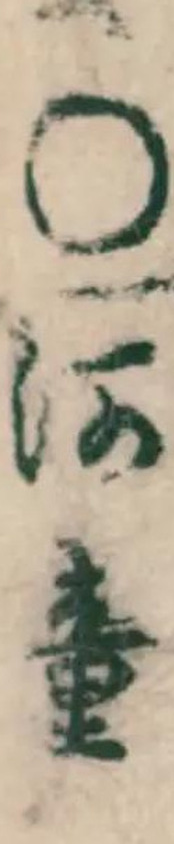○河童

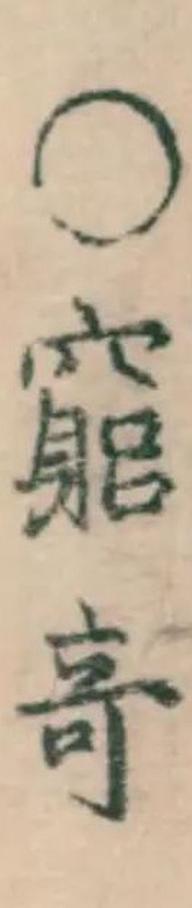○窮奇
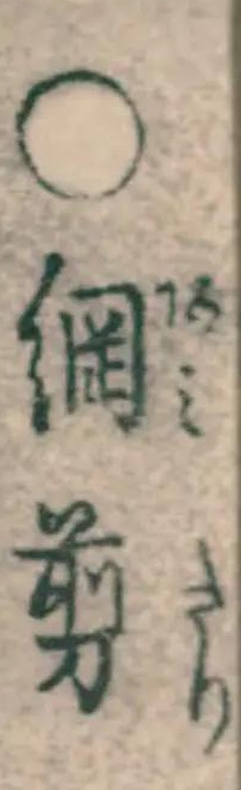○網剪

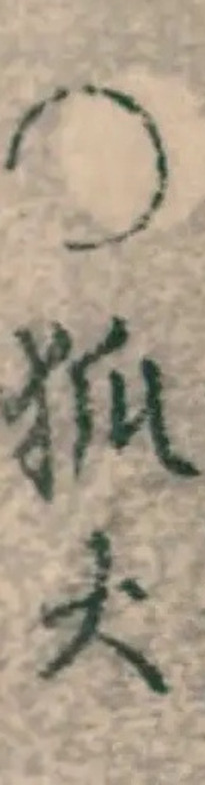○狐火

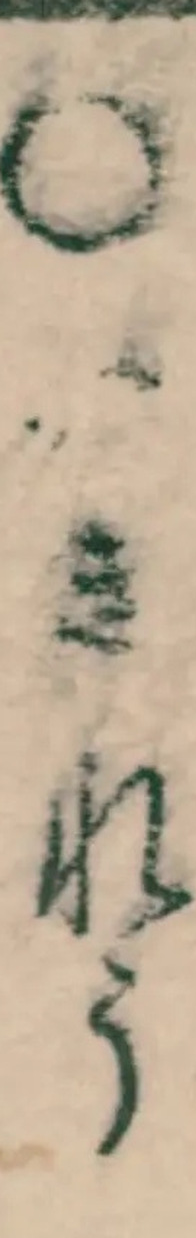○いきれう

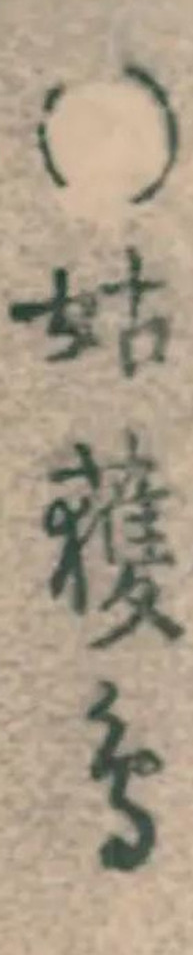○姑獲鳥

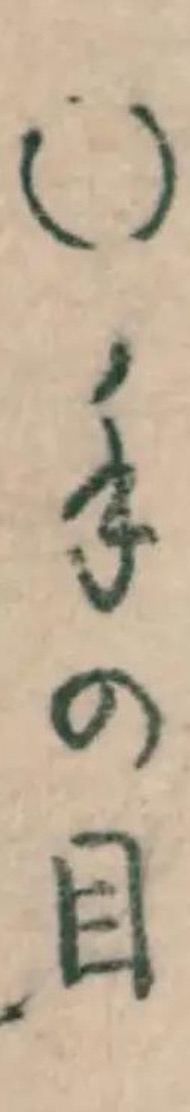○手の目

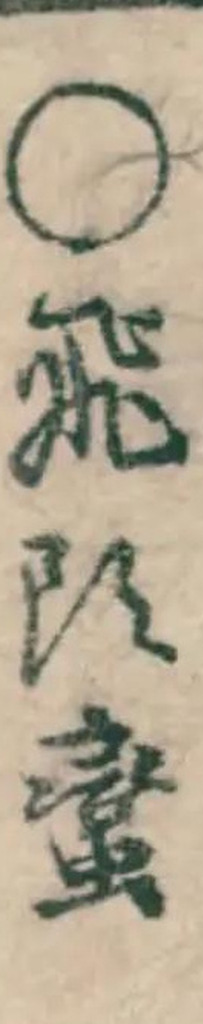○飛頭蛮

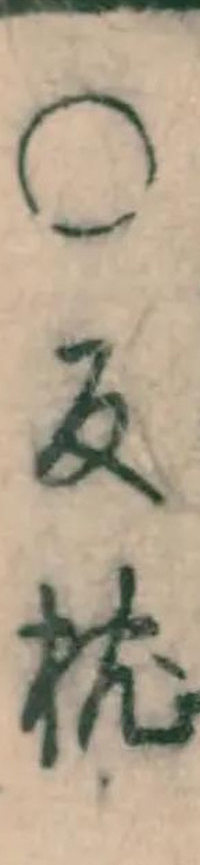○反枕
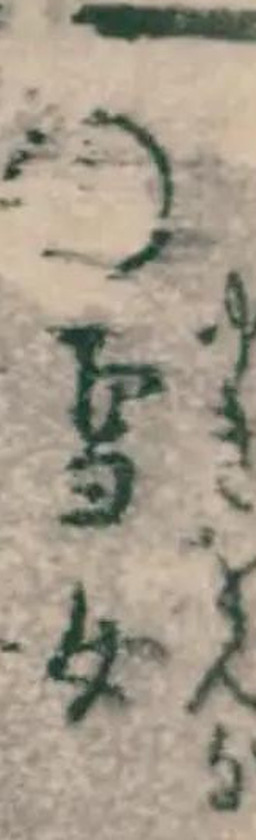○雪女

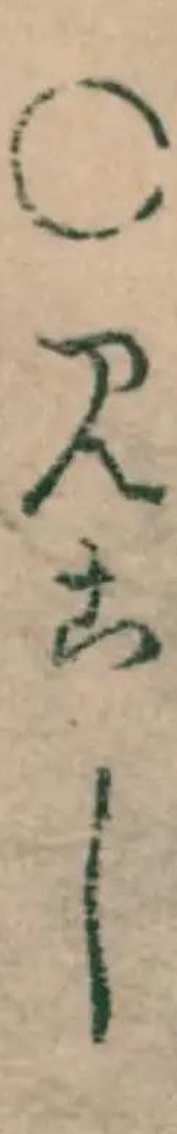○見こし
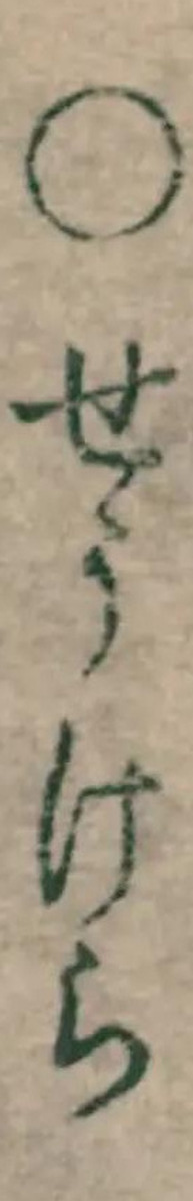○せうけら
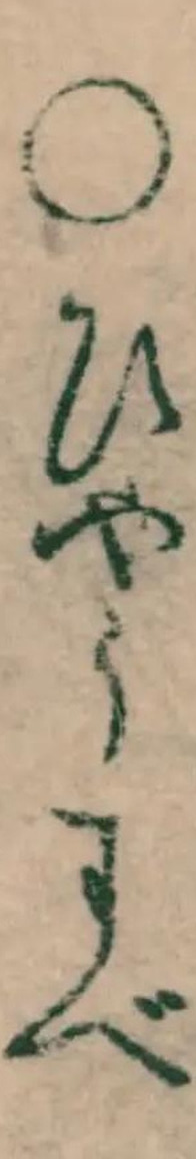○ひやうすべ
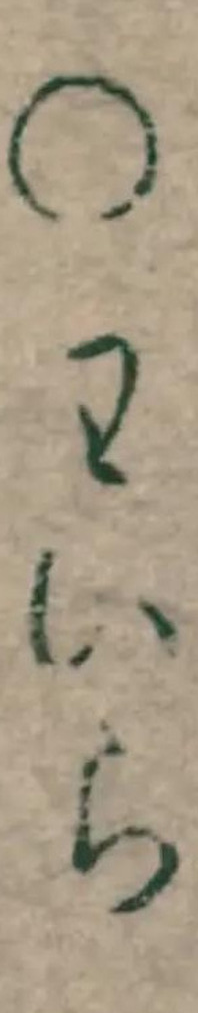○わいら
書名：百鬼夜行 3巻拾遺3巻. [1]
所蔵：国立国会図書館 National Diet Library, JAPAN
